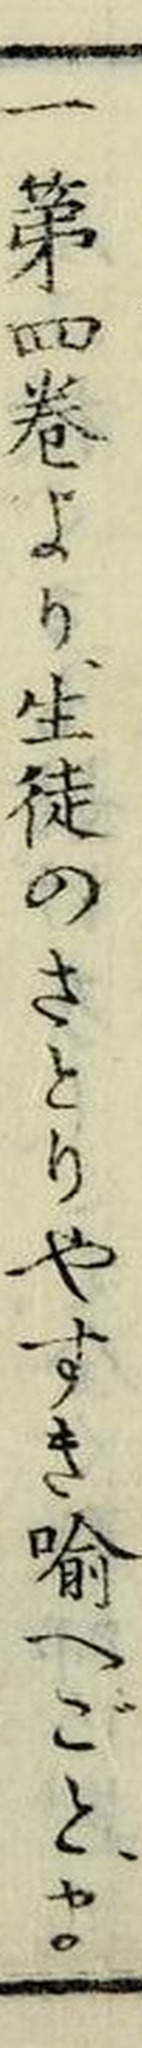一第四巻より、生徒のさとりやすき喩へごと、ま
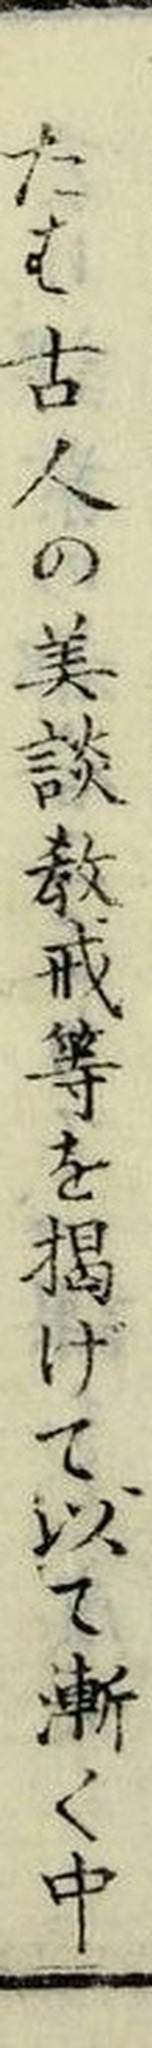たは古人の美談教戒等を掲げて、以て漸く中
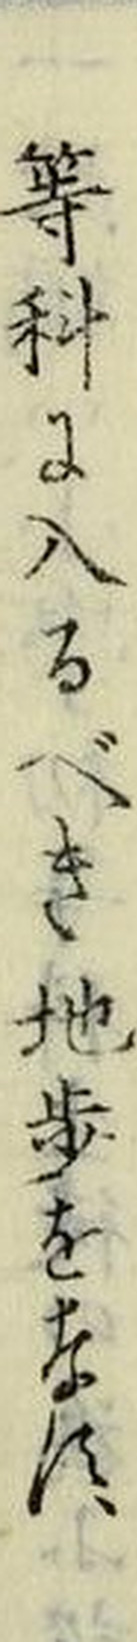等科に入るべき地歩をなす、
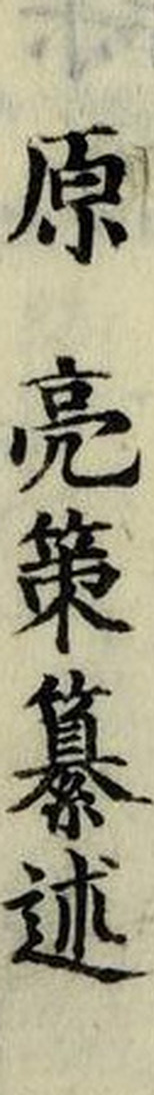原亮策纂述
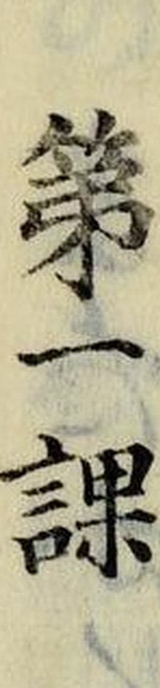第一課
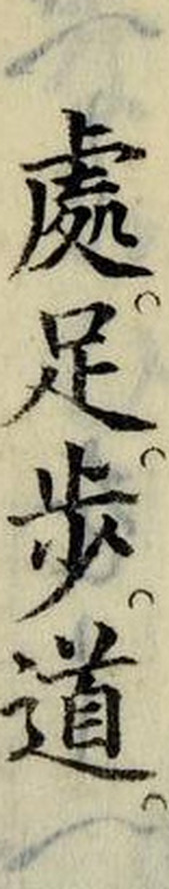処。足。歩。道。
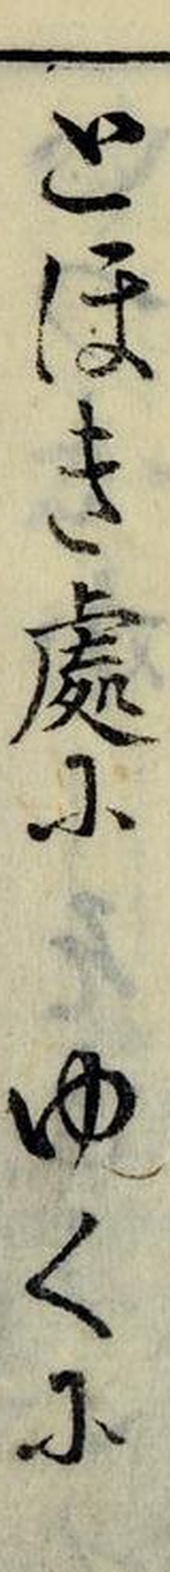とほき処にゆくに
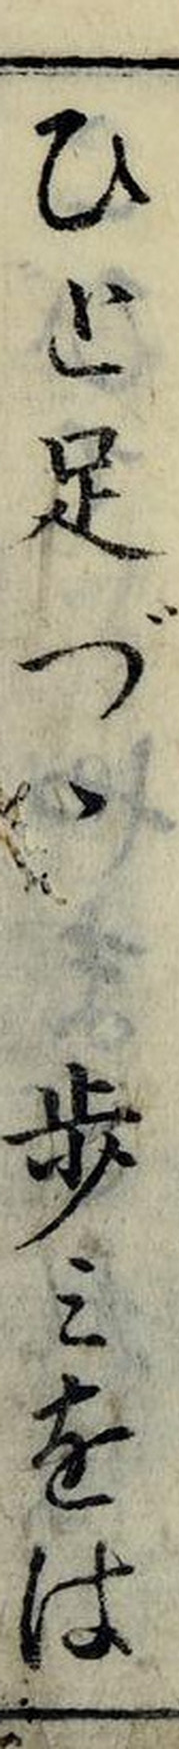ひと足づゝ歩みをは

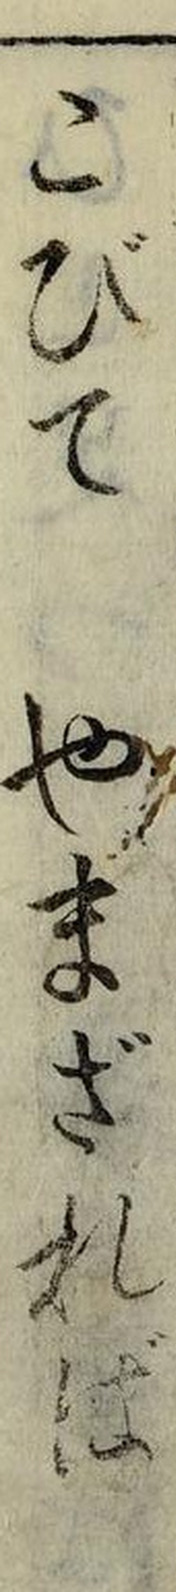こびてやまざれば
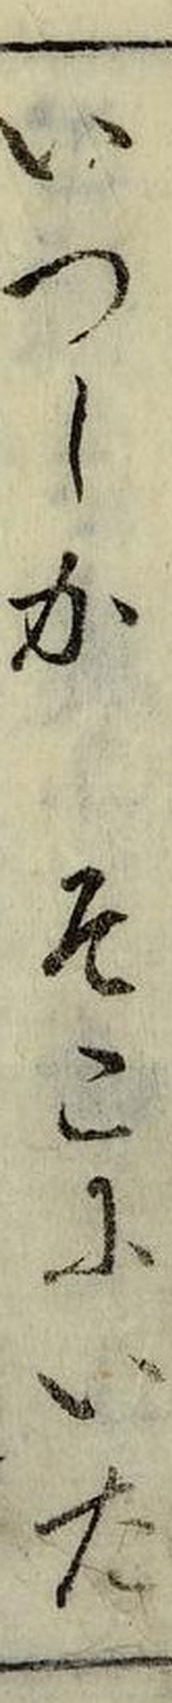いつしかそこにいた
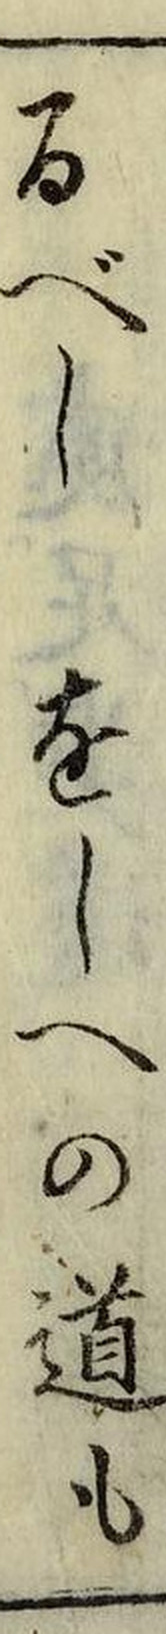るべしをしへの道も
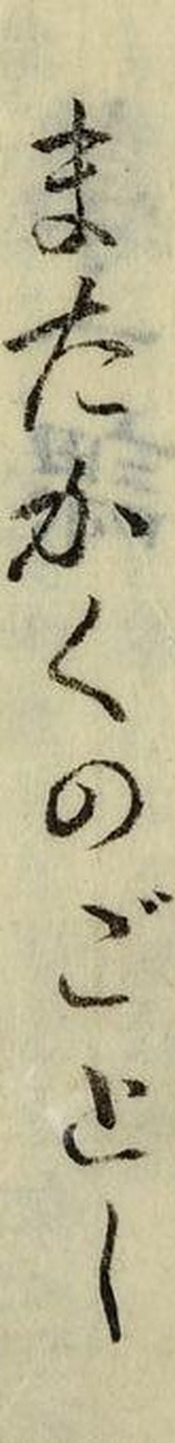またかくのごとし
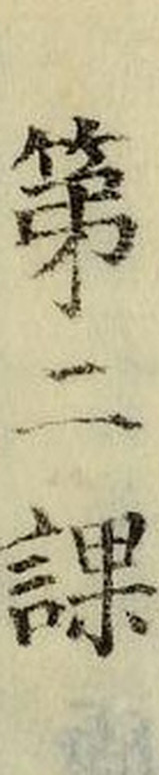第二課
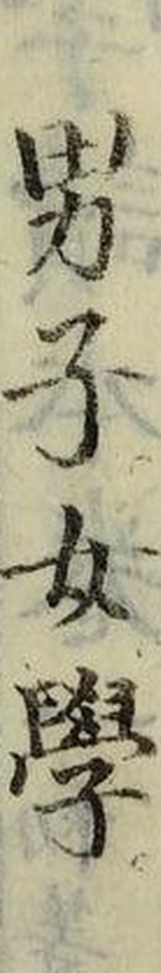男子女学。
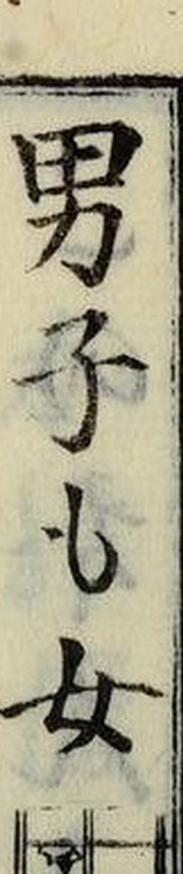男子も女
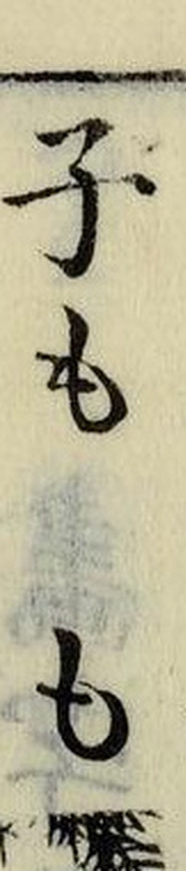子もも
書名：小学読本 初等科 巻一
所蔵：福井県文書館 Fukui Prefectural Archives
